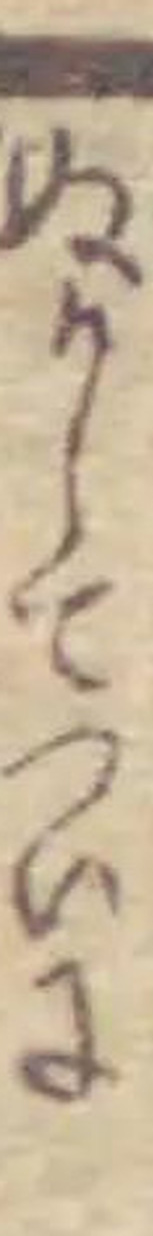ぬかしてついに
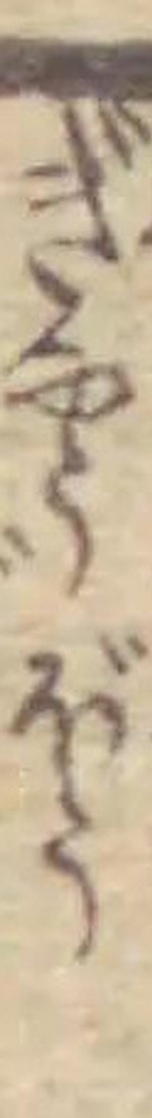ぎやうぼう
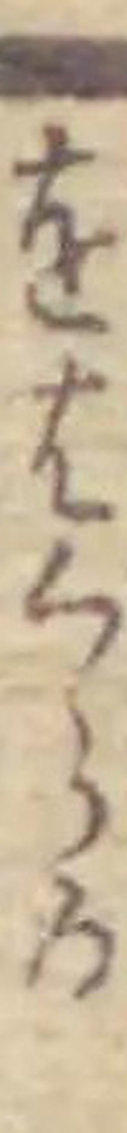をはぐらか
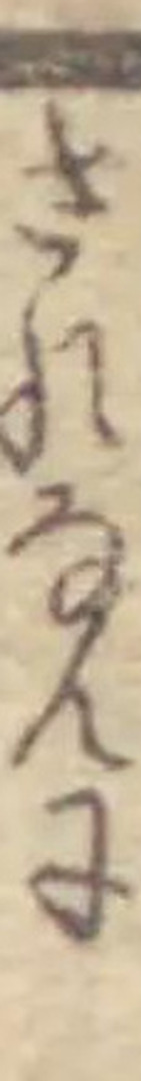されなんに
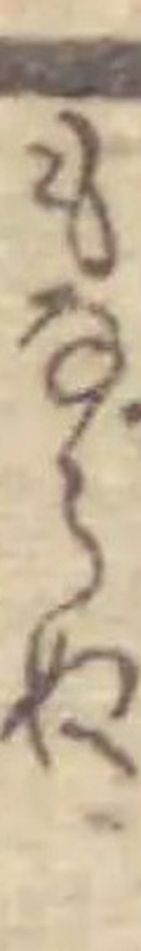もならぬ
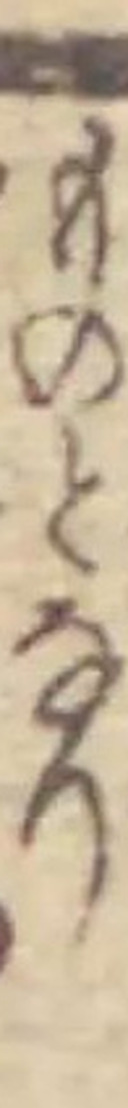ものとなり
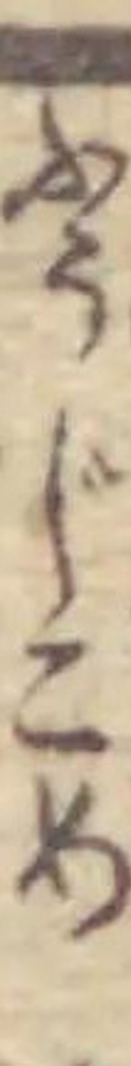ふうじこめ
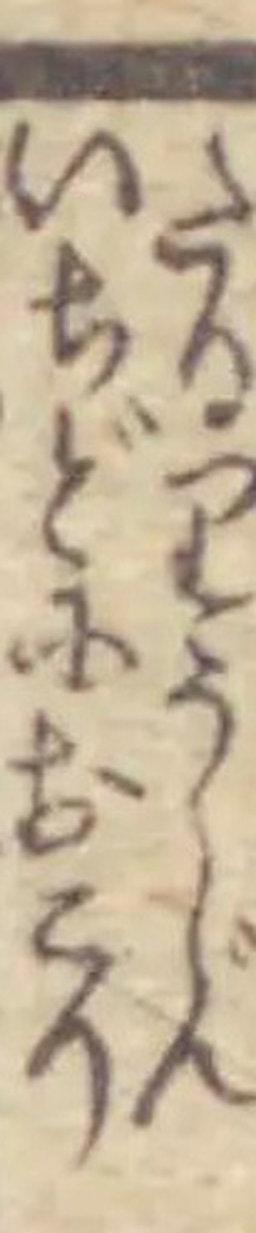いちどにおころ
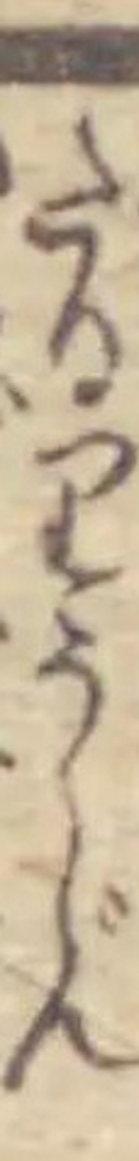たるりうじん
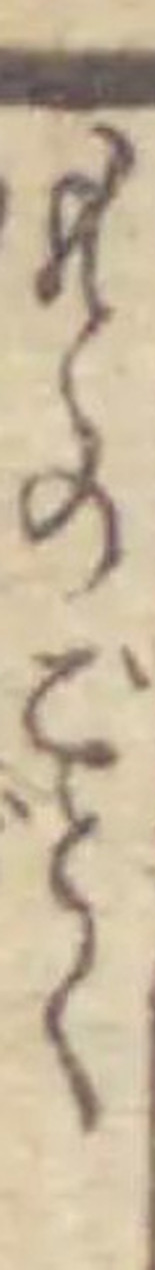もとのごとく
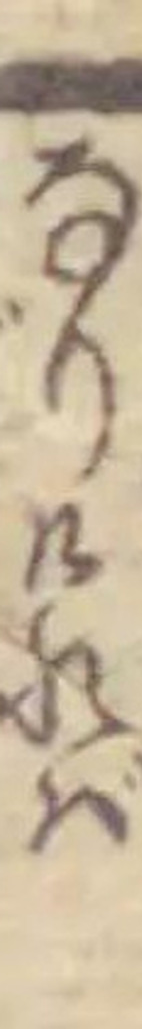なりければ
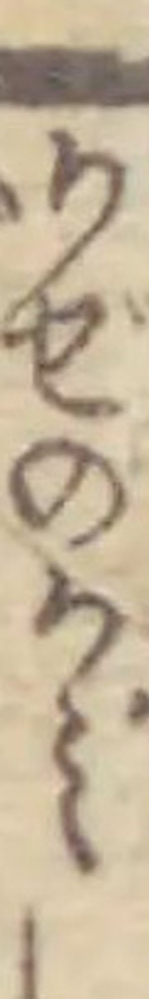かぜのかみ
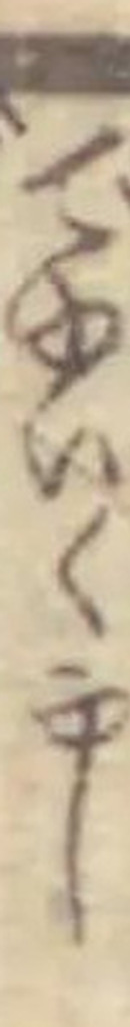でやいくやし
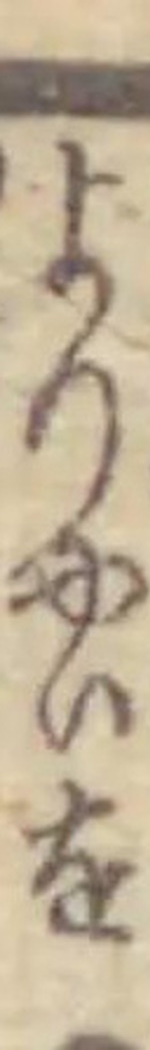よりやいを
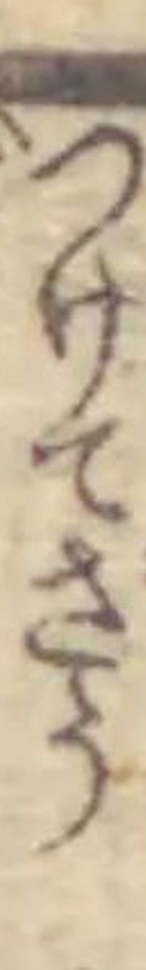つけてさう
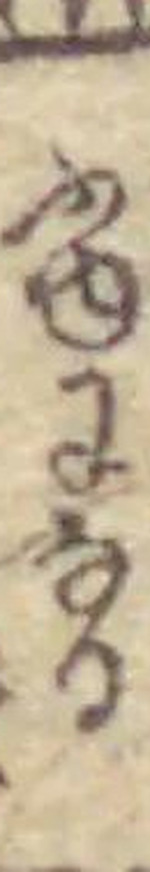ふゆになる
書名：雨宮風宮出儘略縁記 3巻
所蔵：国立国会図書館 National Diet Library, JAPAN
